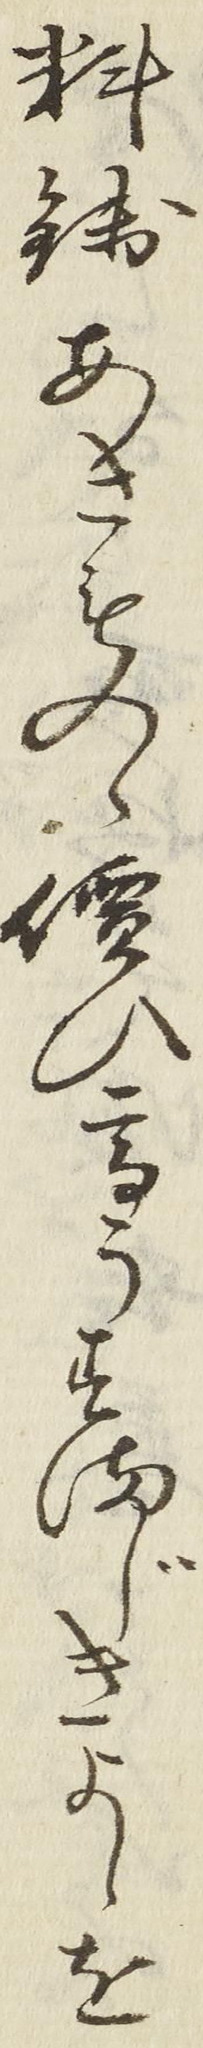料銭あきものゝ価ひ高うすまじきよしを
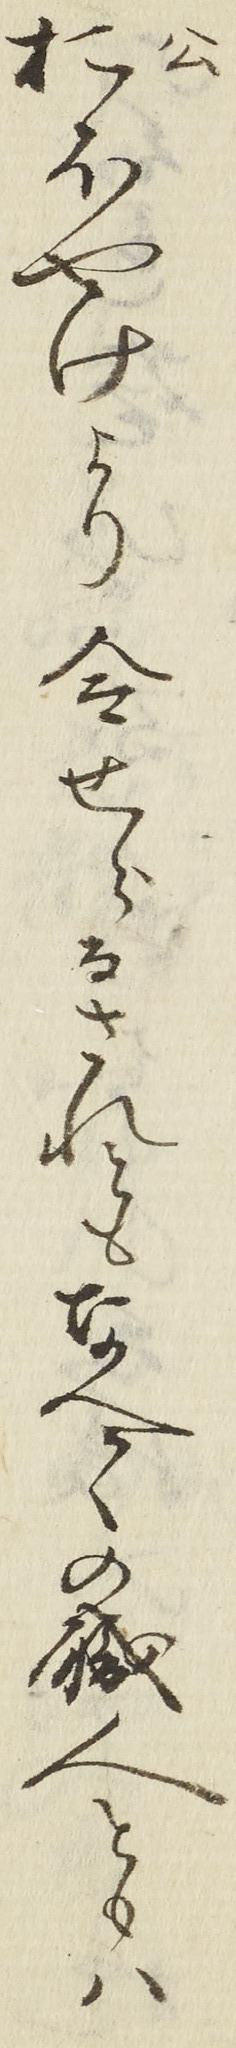お公ほやけより令せらるされともなへての職人ともは
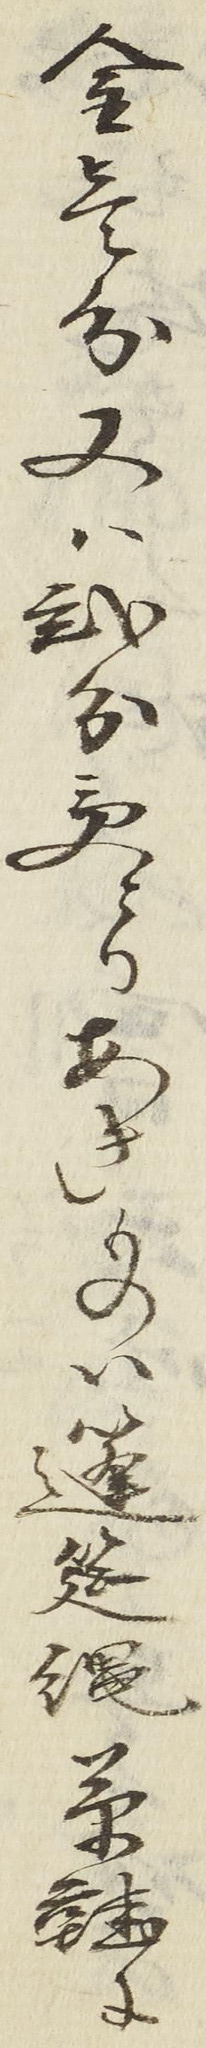金壱分又は弐分受とりあきものは篷筵縄草鞋に

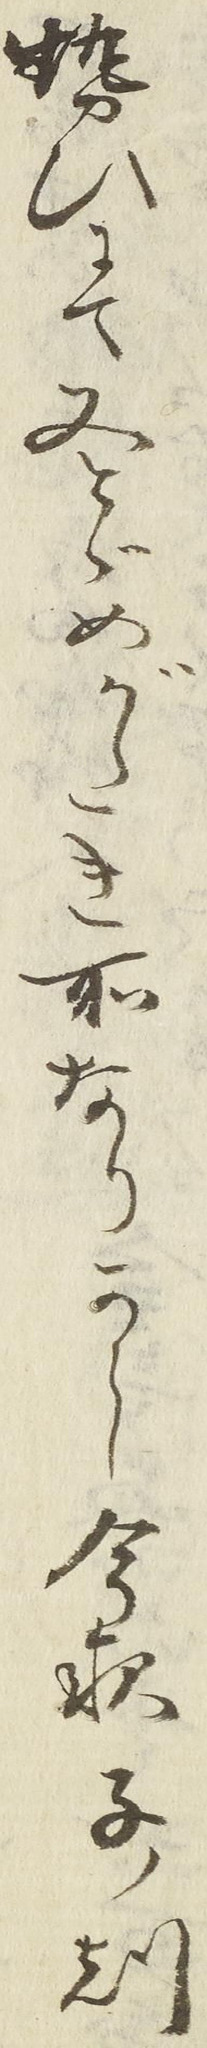勢ひにて又とゞめがたき所なりかし今夜子の刻
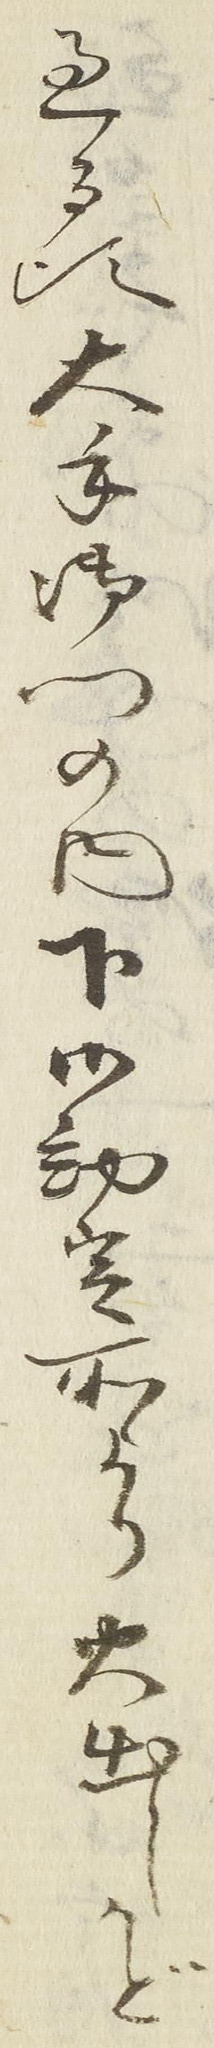過る頃大手御門の内下御勘定所より火出しかど
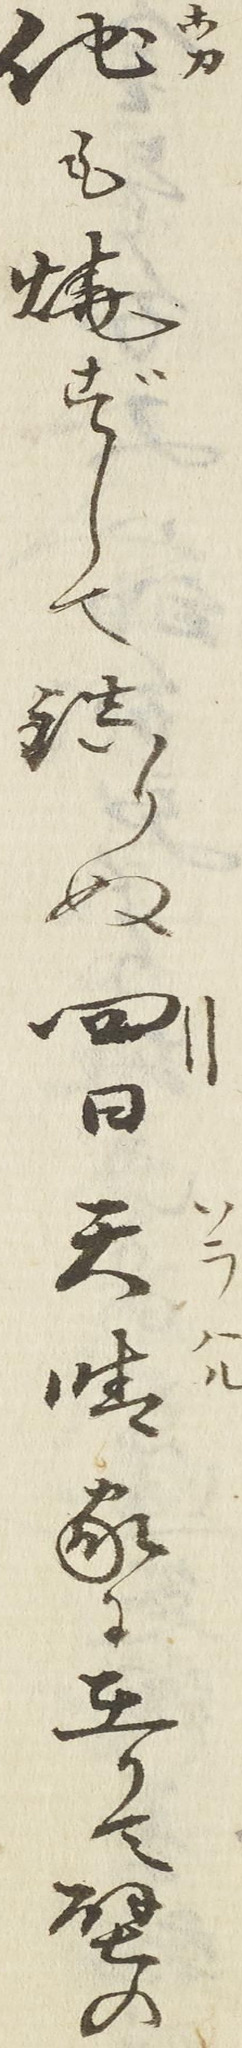他も焼ずして鎮りぬ四日天晴家に在りて壁の
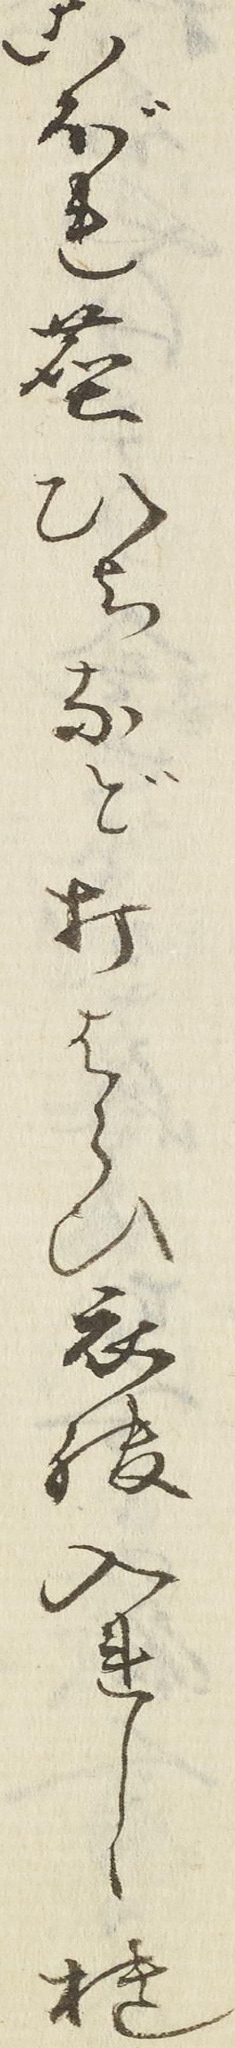こぼれ塵ひちなど打はらひ衣服入し櫃
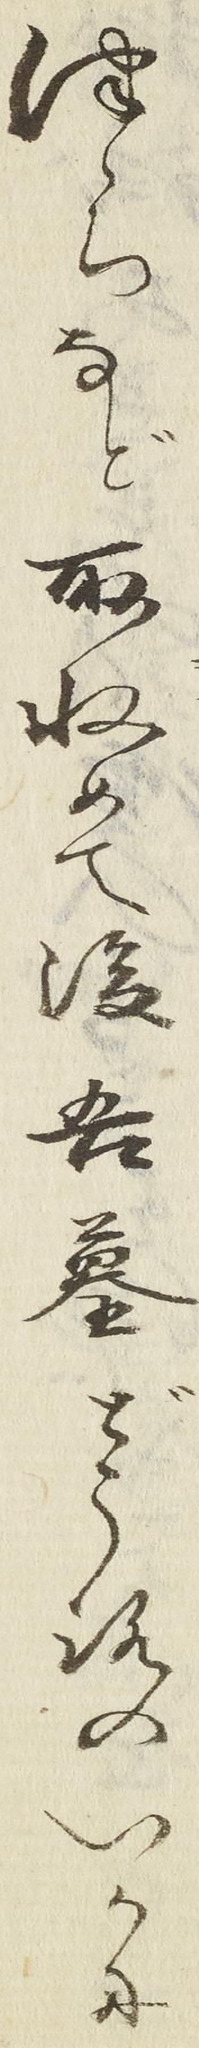つゝらなど取収めて後吾墓どうろのいかに
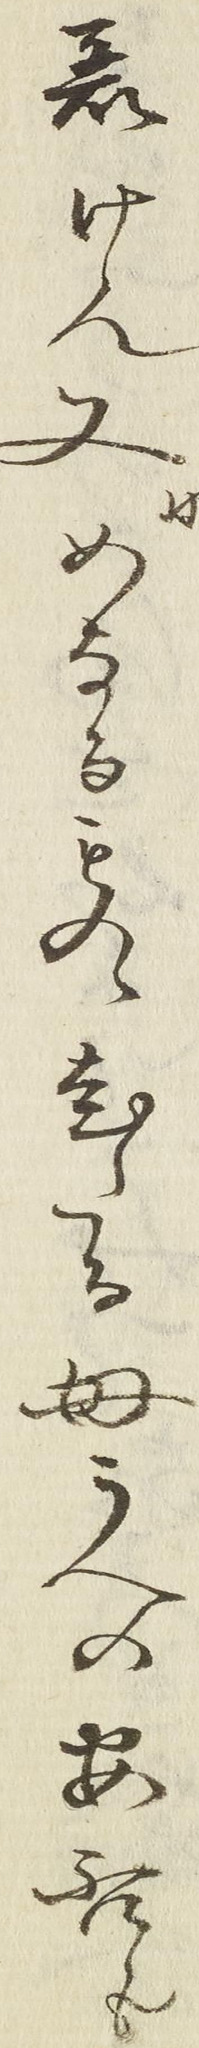荒けん又め婦なるものゝ老たる母うへの安否も
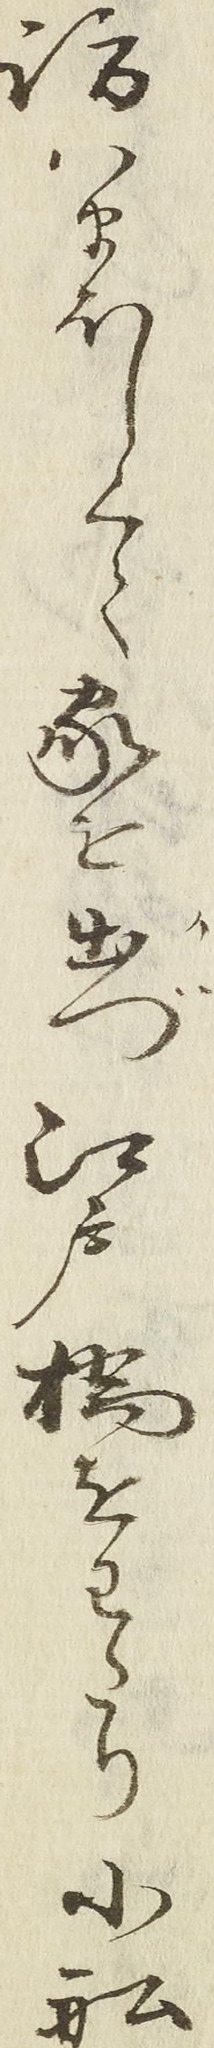訪はまほしくて家を出づ江戸橋をわたり小船
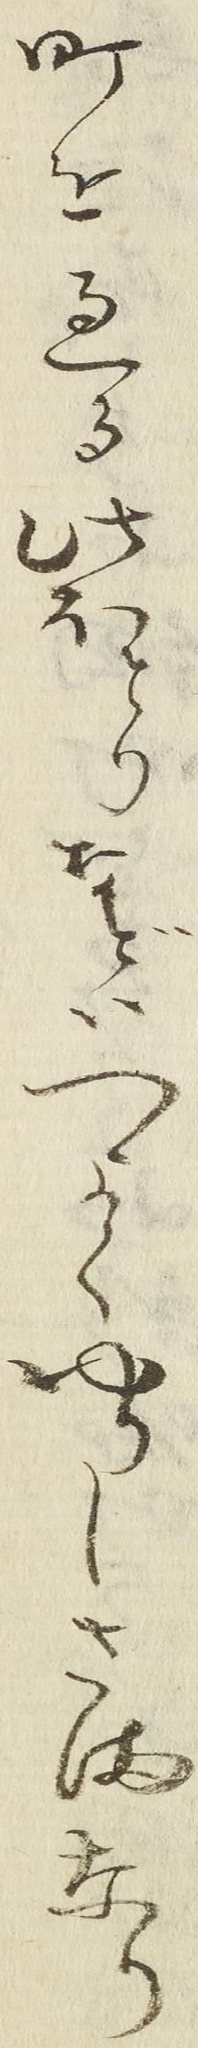町を過る此ほとりなどはつよくゆりしさまなり
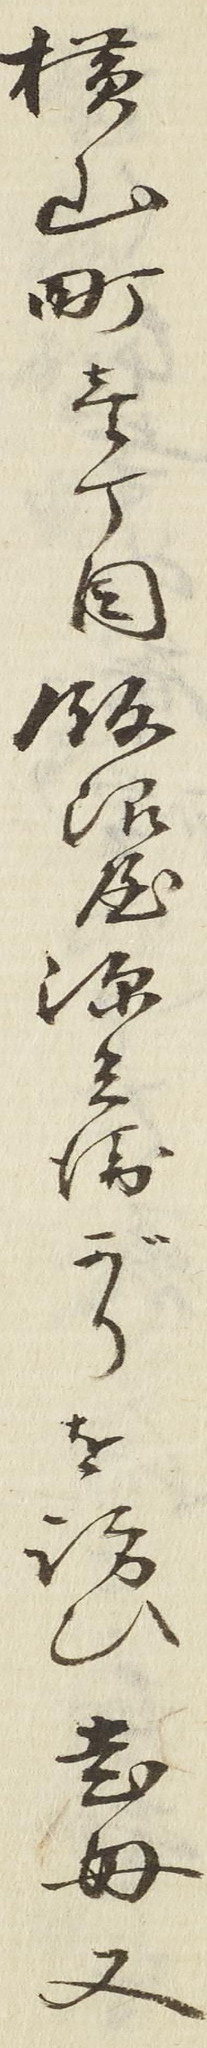横山町壱丁目飯沼屋源兵衛がりを訪ひ老母又
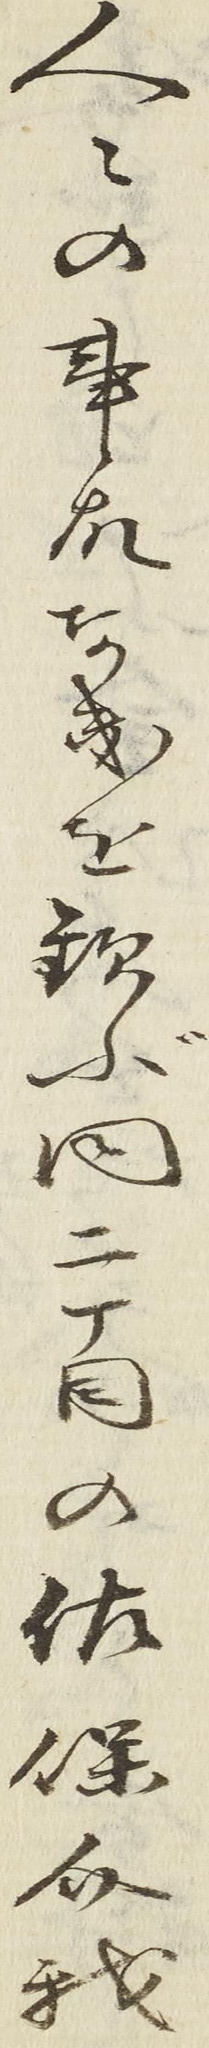人〻の事故なきを歓ぶ同二丁目の佐葆介我
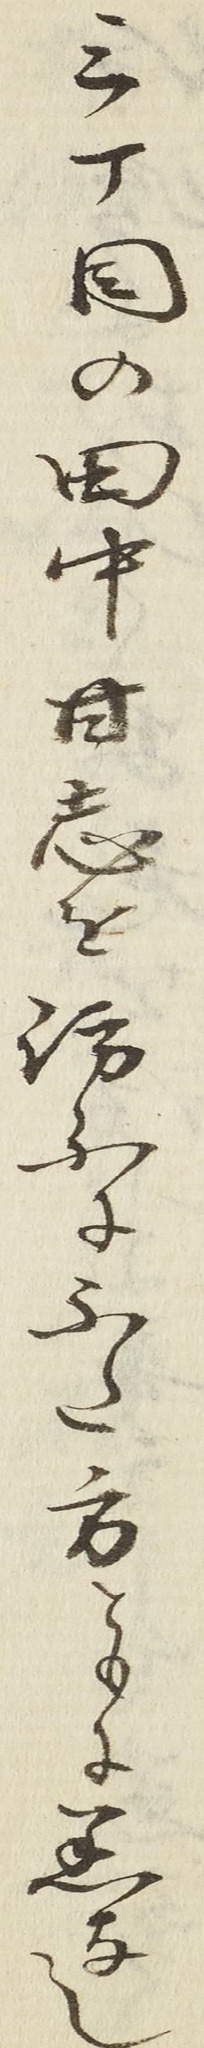三丁目の田中甘志を訪ふにふた方ともに恙なし
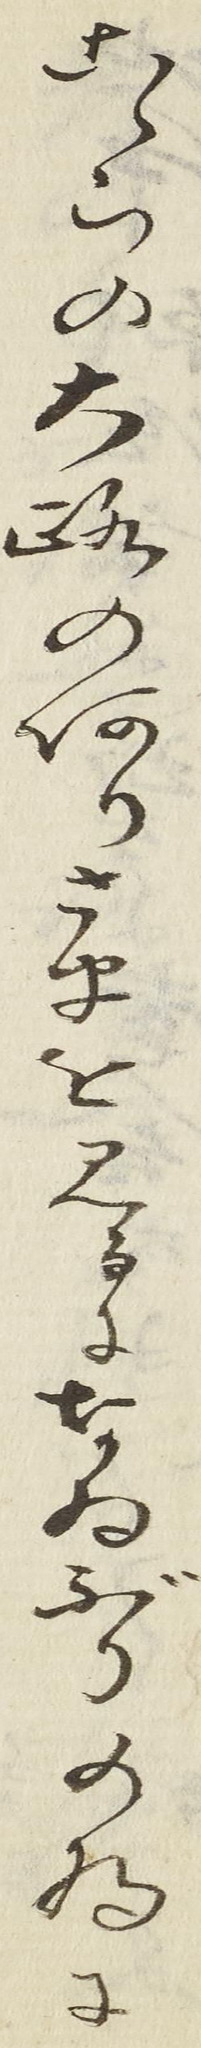こゝらの大路のありさまを見るになゐぶりの為に
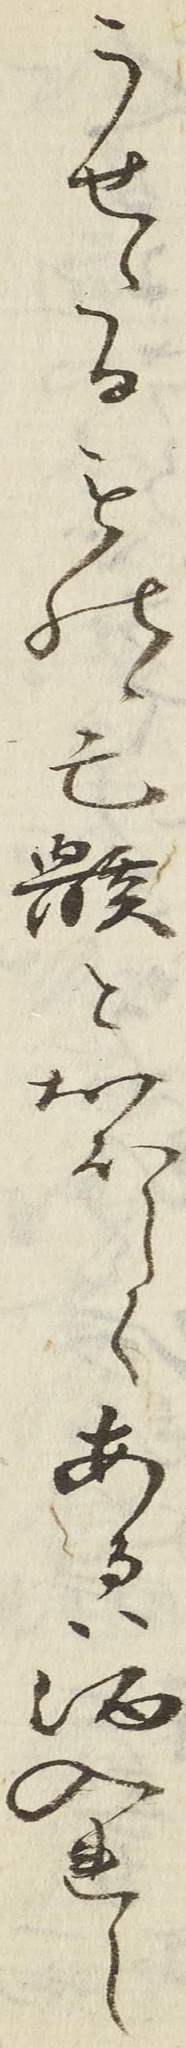うせたるものゝ亡骸とおぼしくある或は酒入れし
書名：やぶれ窓の記　全
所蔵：東京大学地震研究所図書室 Earthquake Research Institute Library, The University of Tokyo, JAPAN
